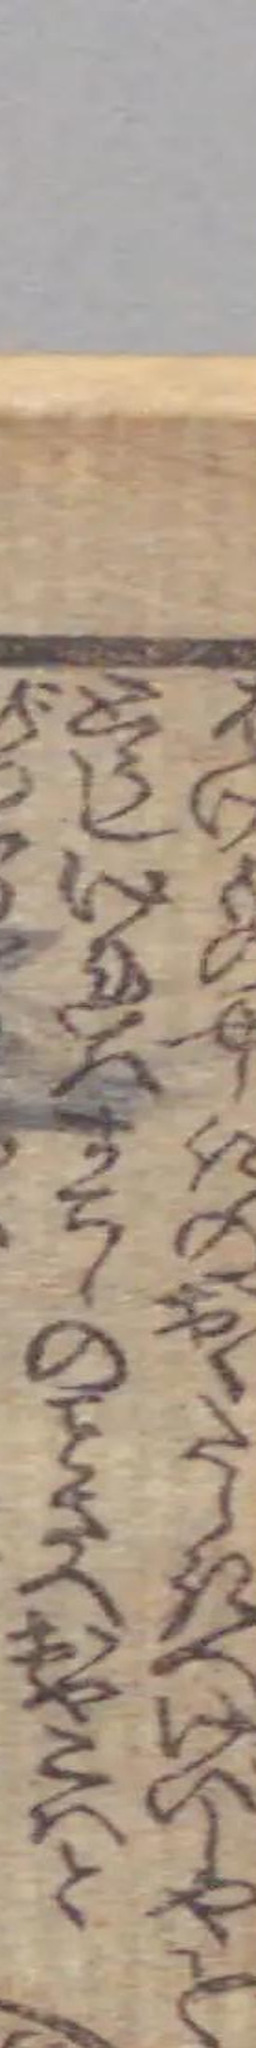とうしけれはすこしのことさへおやこはと
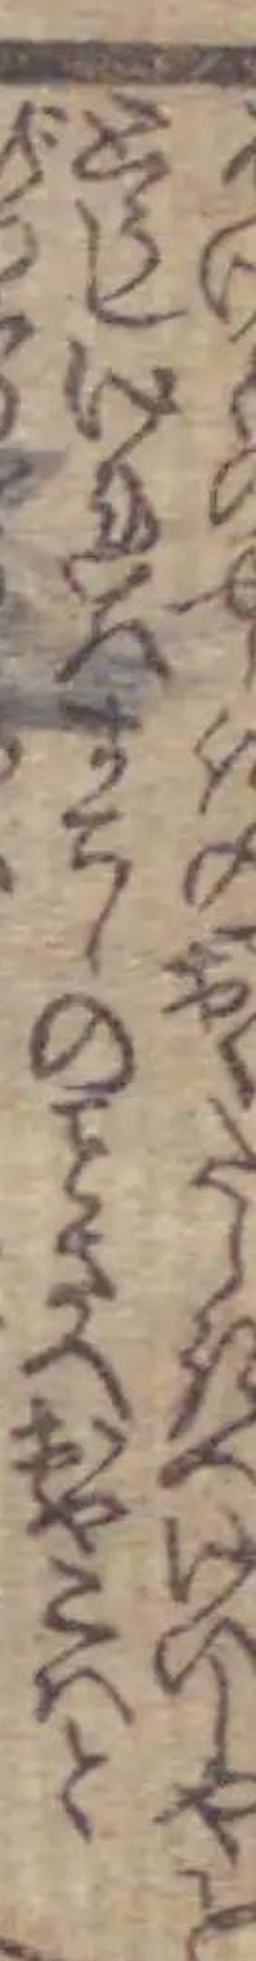とうしけれはすこしのことさへおやこはと
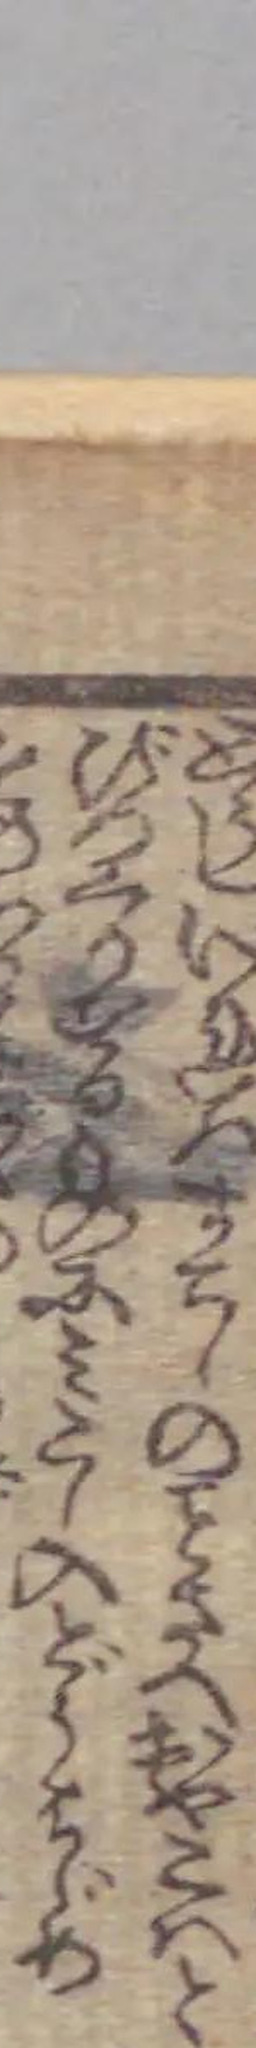びつくりするものにみこし入どうはじめ
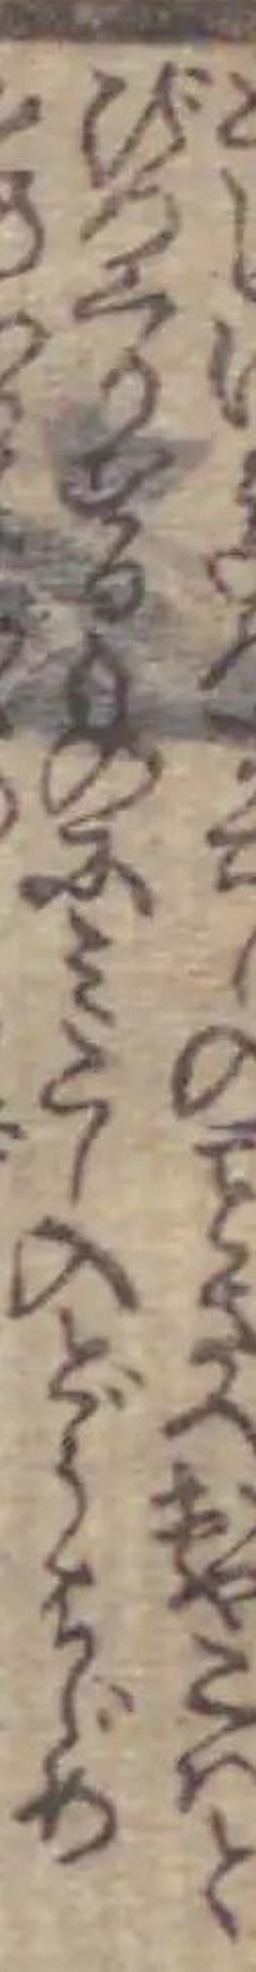びつくりするものにみこし入どうはじめ
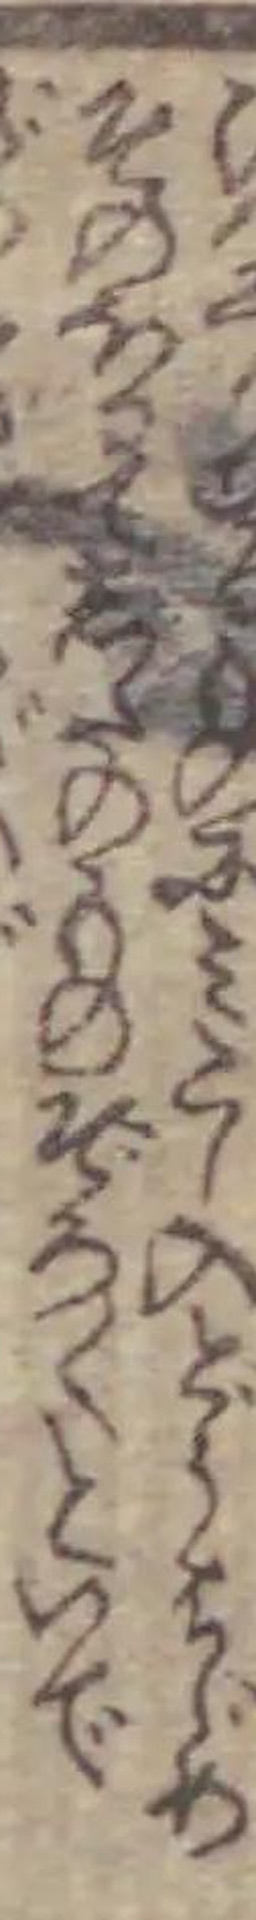そのほかてしたのものぞろ〳〵といで
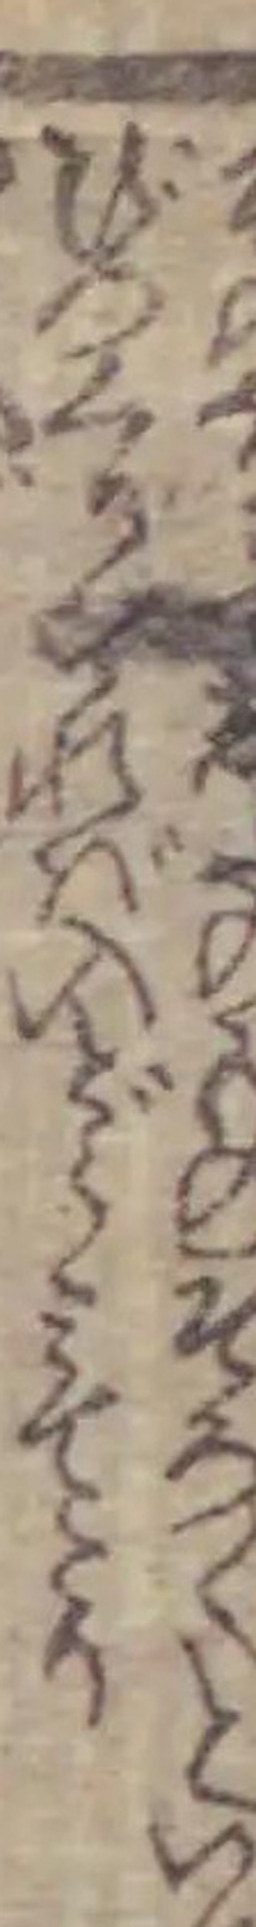びつくりすれば入どうみてとり
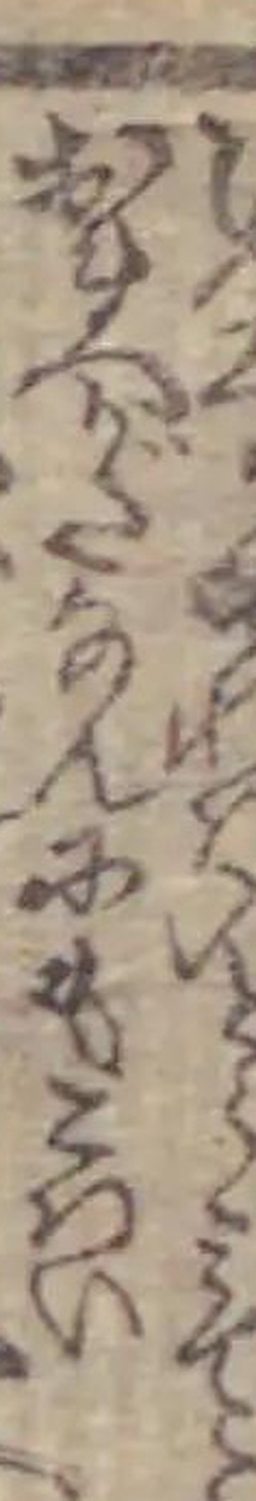おまへがたなんにもこはい
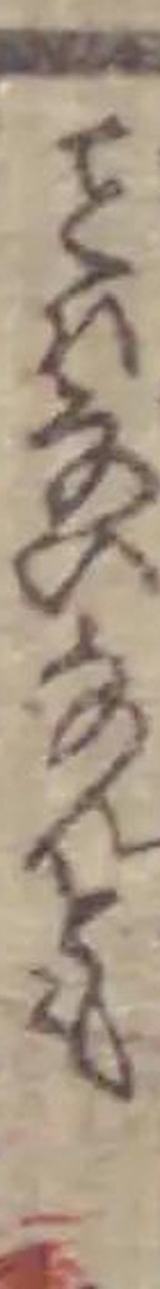ことはないなんとも
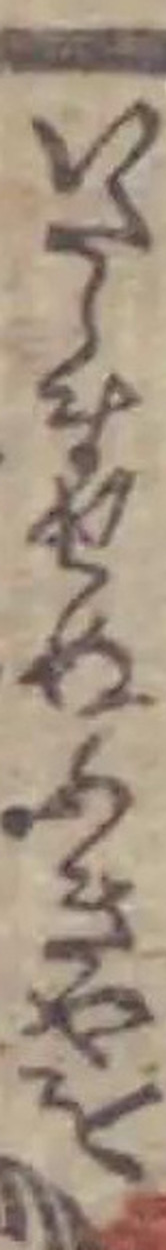いたしませぬふきやを
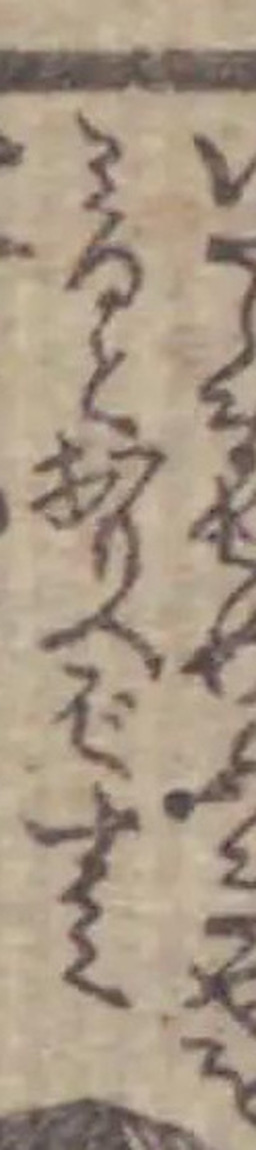みるとおもへばすみ
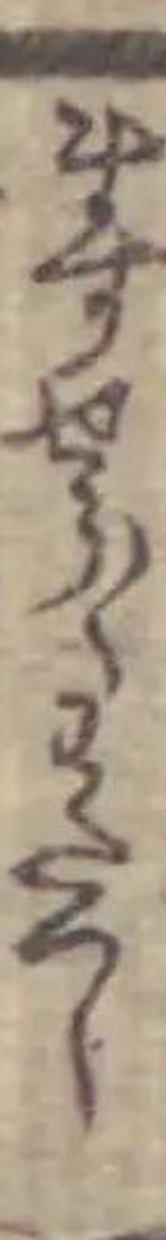ますせう〳〵わたくし
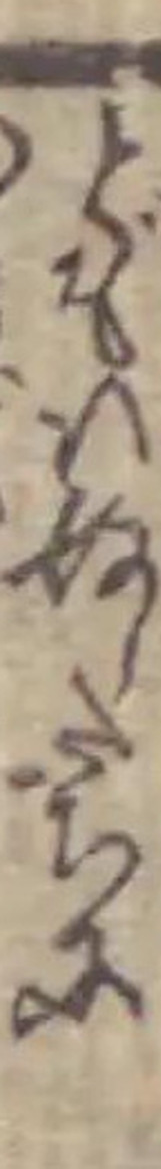どもはぬしたちに
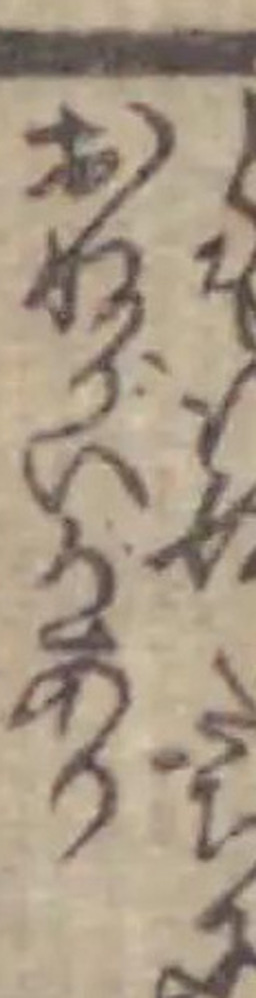おねがいかあり
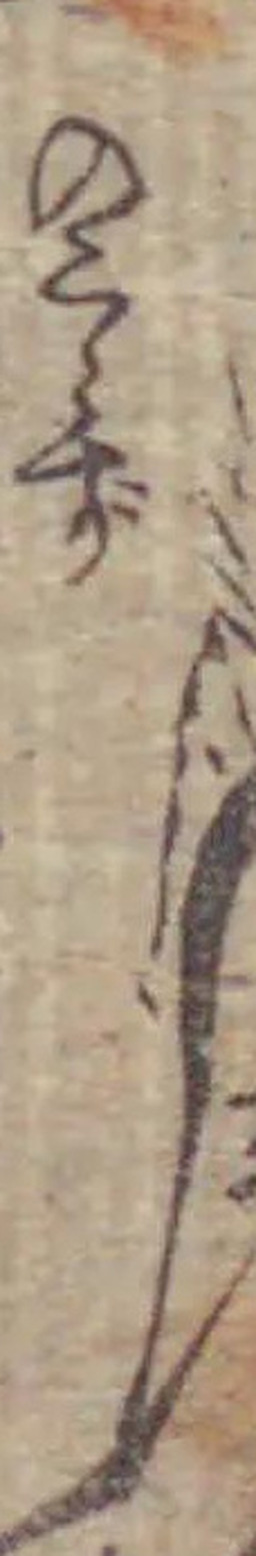のこらず
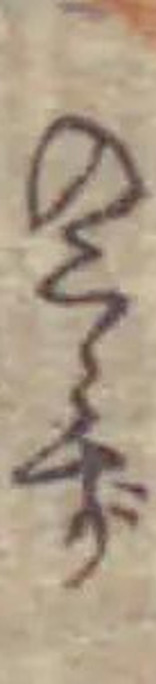のこらず
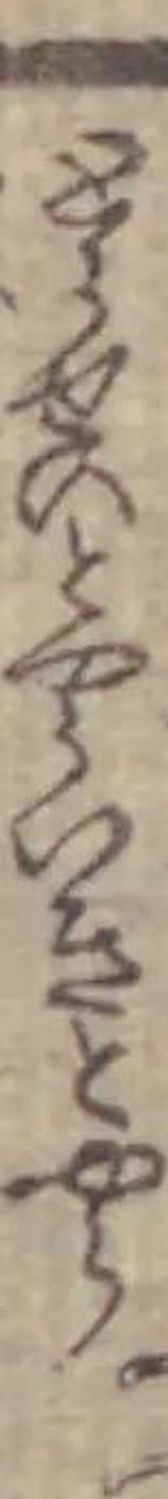とうせいとやらいきとやら
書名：化物昼寝鼾 2巻
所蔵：国立国会図書館 National Diet Library, JAPAN
